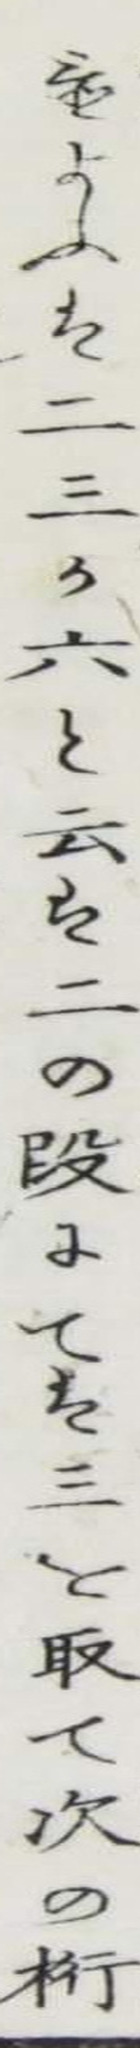置よふは二三．か六と云は二の段にては三を取て次の桁
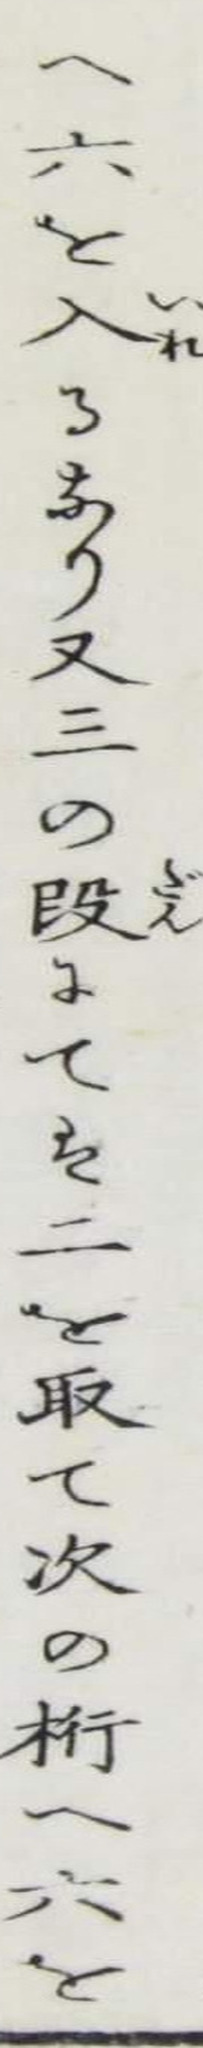へ六を入るなり又三の段にては二を取て次の桁へ六を
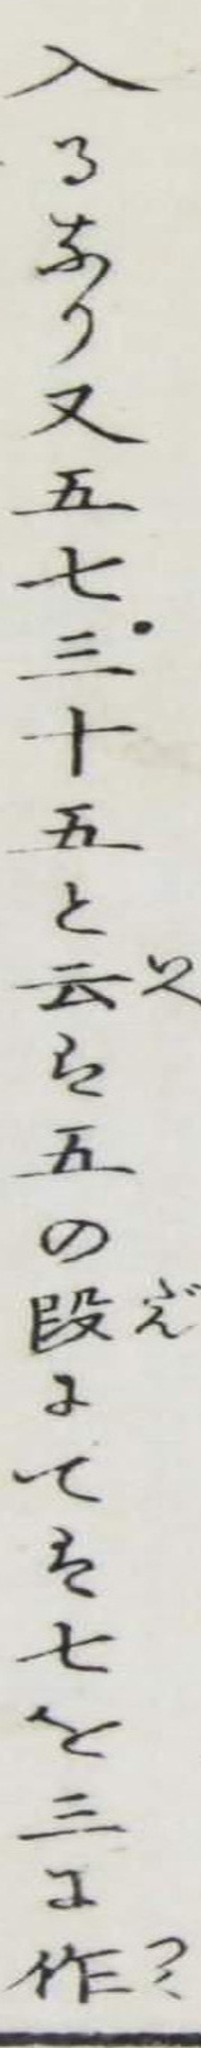入るなり又五七．三十五と云は五の段にては七を三に作
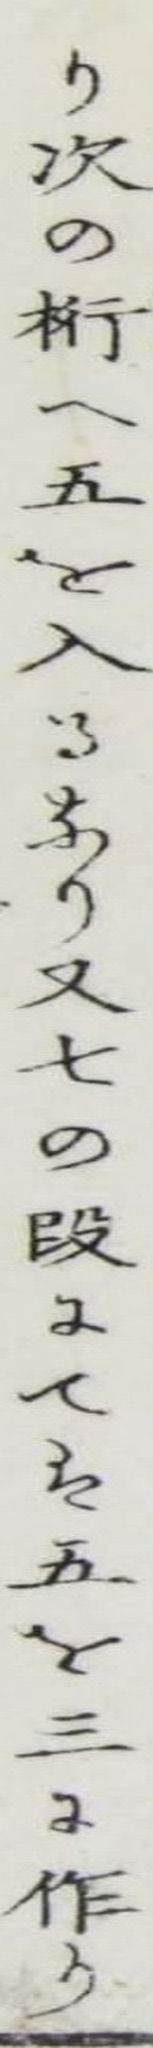り次の桁へ五を入るなり又七の段にては五を三に作り
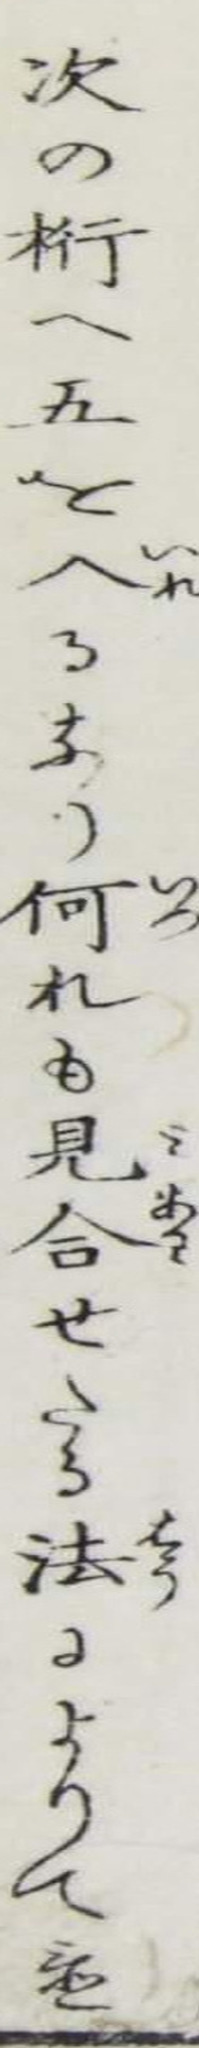次の桁へ五を入るなり何れも見合せたる法によりて置
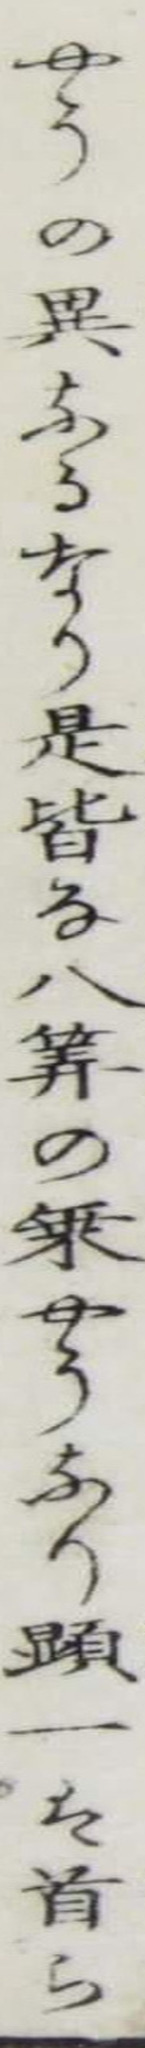やうの異なるなり是皆な八算の乗やうなり顕一は首ら

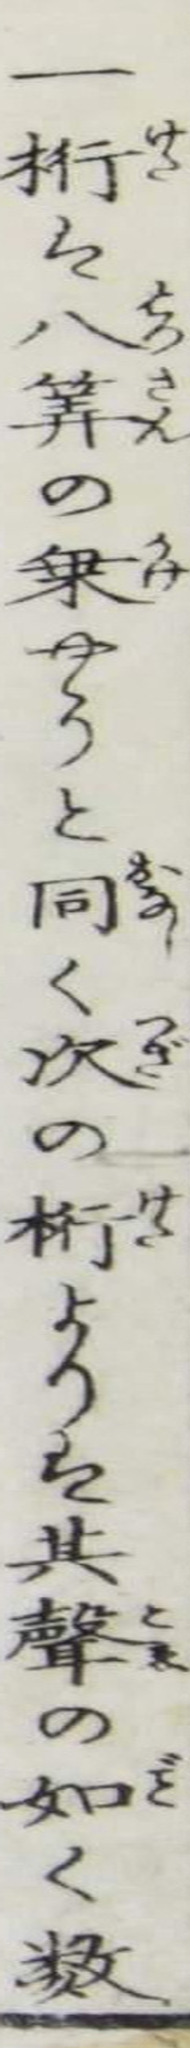一桁は八算の乗やうと同く次の桁よりは其声の如く数
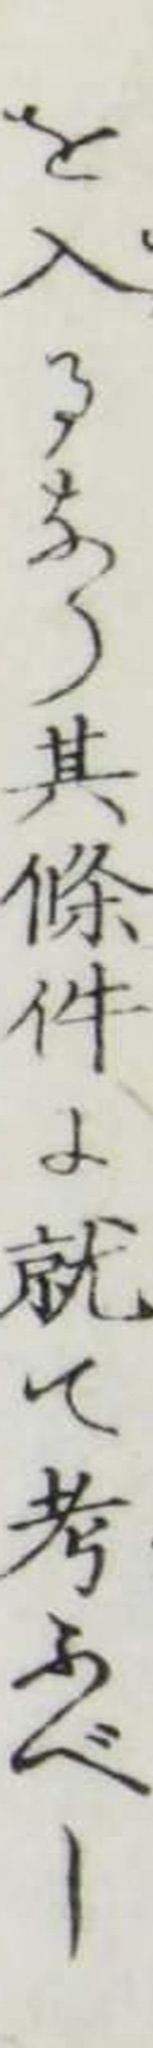を入るなり其条件に就て考ふべし
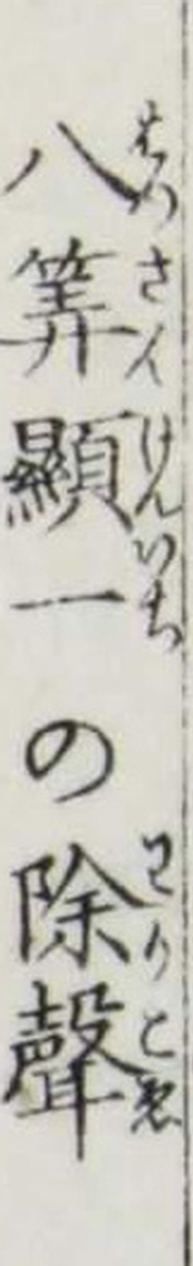八算顕一の除声
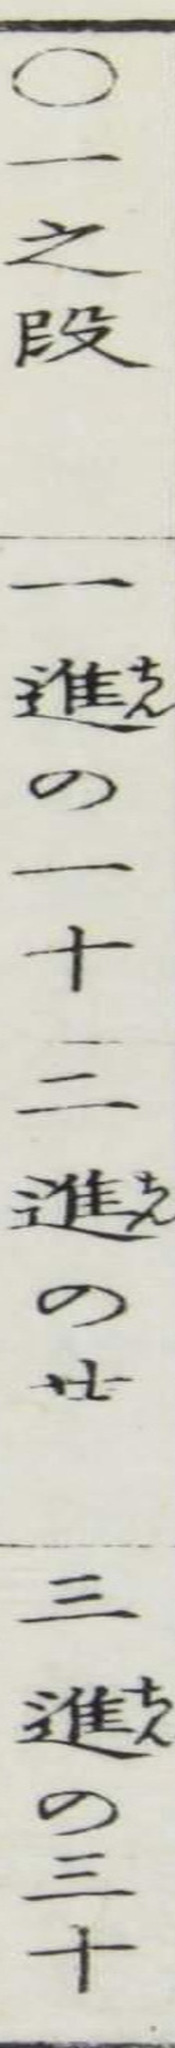○一之段一進の一十二進の廿三進の三十
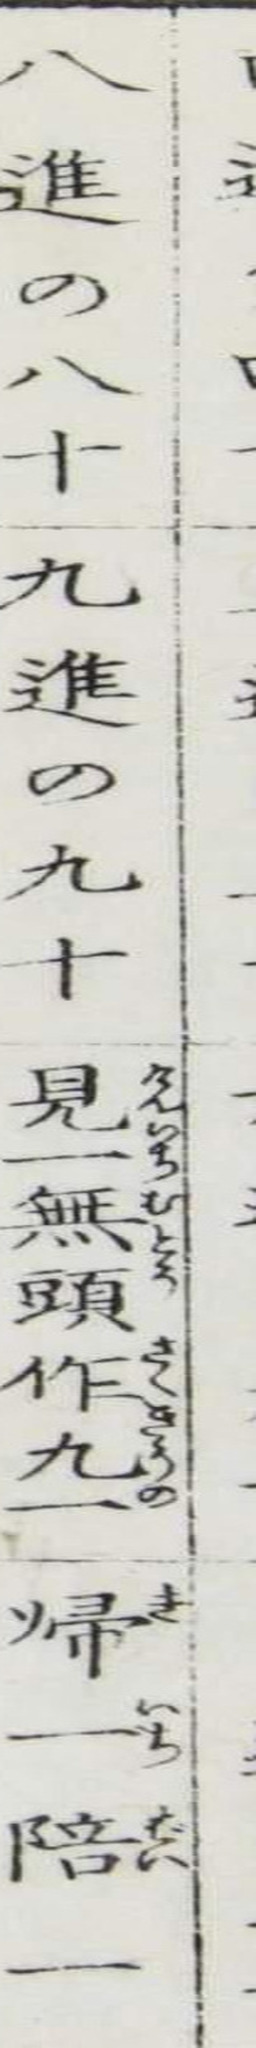八進の八十九進の九十見一無頭作九一帰一陪一
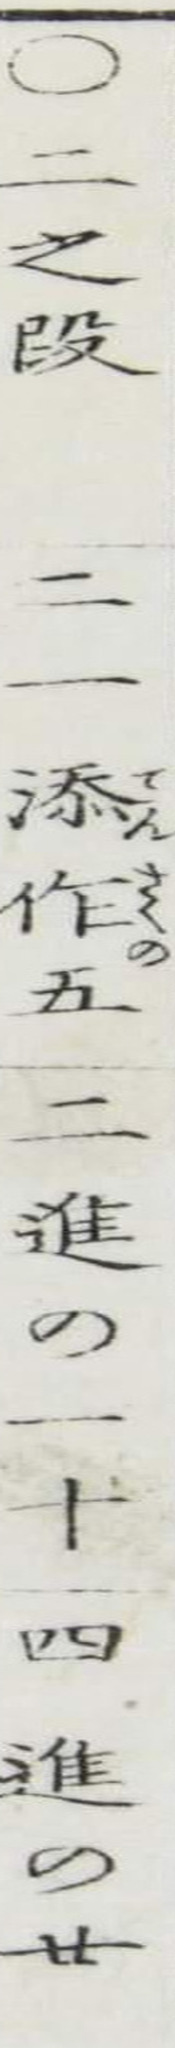○二之段二一添作五二進の一十四進の廿
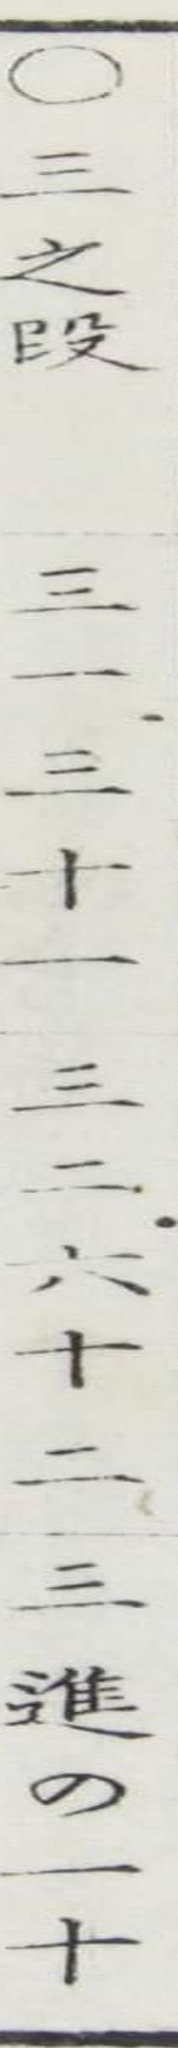○三之段三一．三十一三二．六十二三進の一十
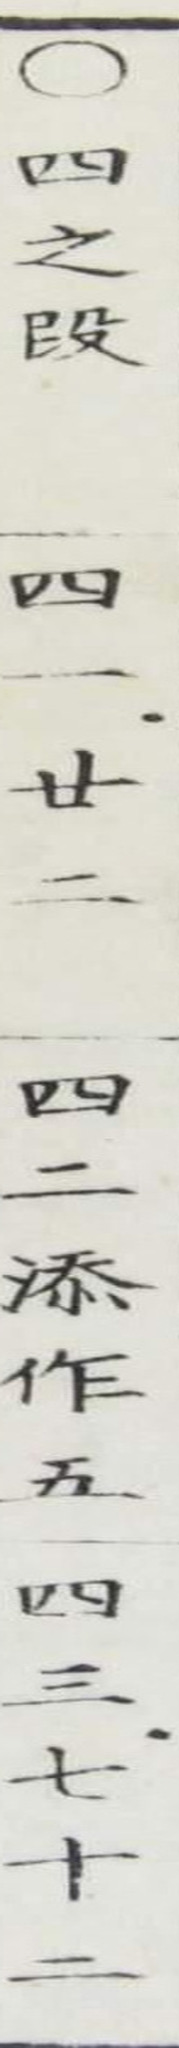○四之段四一．廿二四二添作五四三．七十二
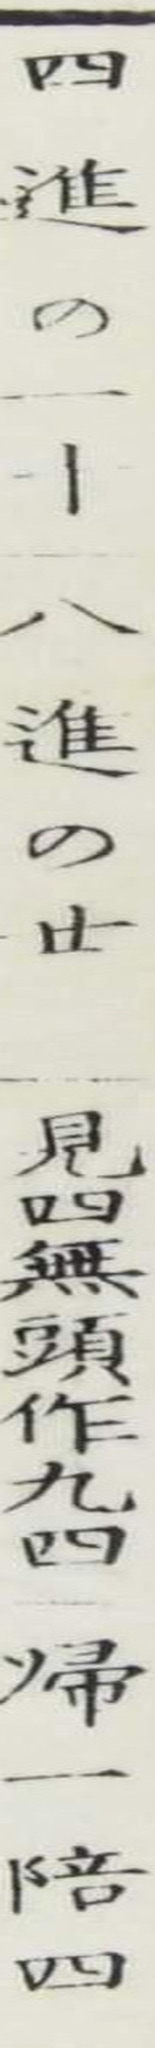四進の一十八進の廿見四無頭作九四帰一陪四
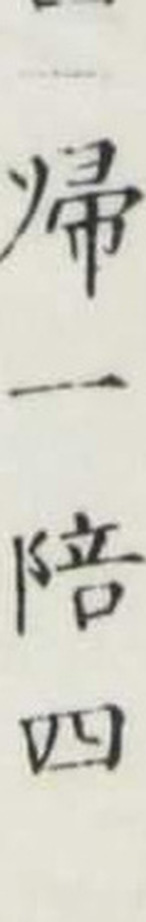帰一陪六
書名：明治小學塵劫記 卷1
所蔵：東京学芸大学教育コンテンツアーカイブ
